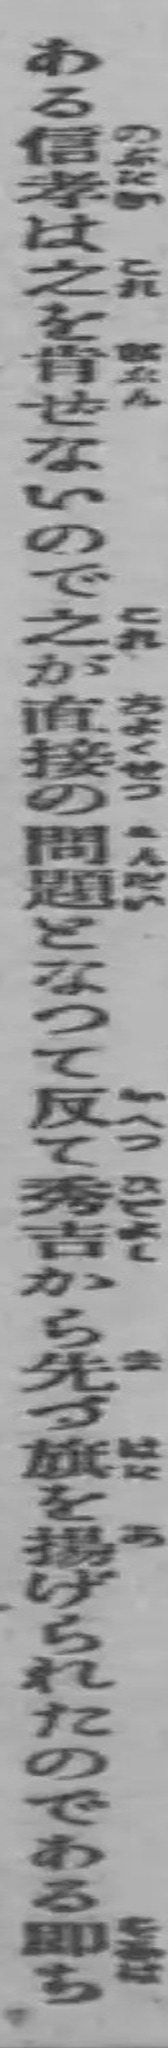ある信孝は之に肯ぜないので之が直接の問題となつて反て秀吉から先づ旗を揚げられたのである即ち
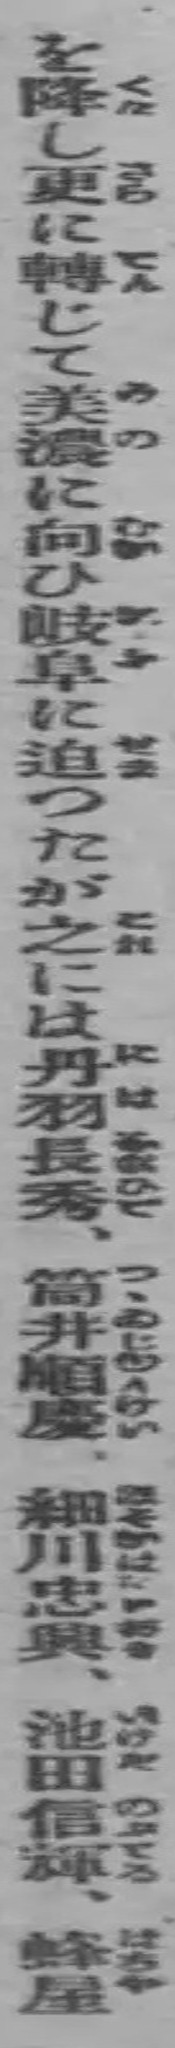を降し更に転じて美濃に向ひ岐阜に迫つたが之には丹羽長秀、筒井順慶、細川忠興、池田信輝、蜂屋

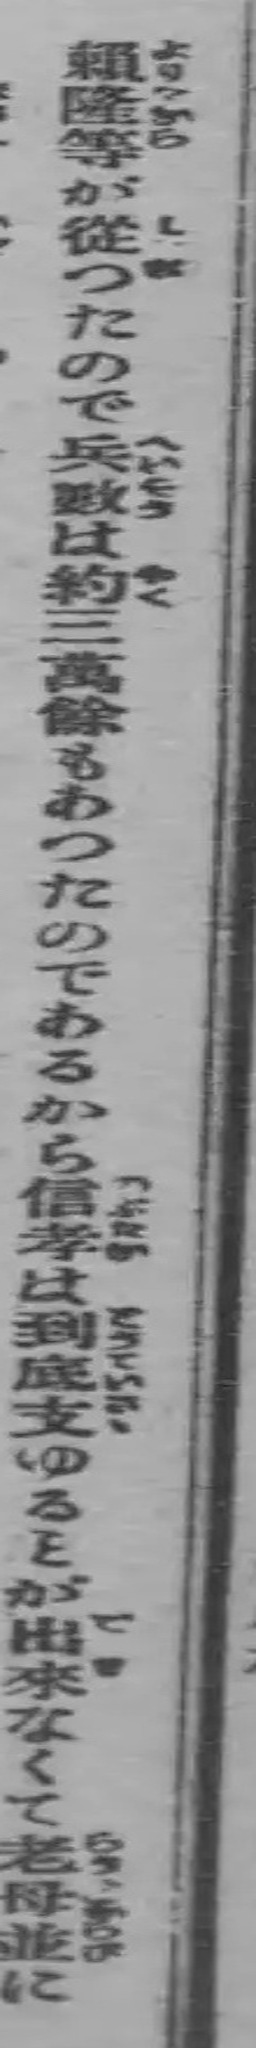頼隆等が従つたので兵数は約三万余もあつたのであるから信孝は到底支ゆることが出来なくて老母並に
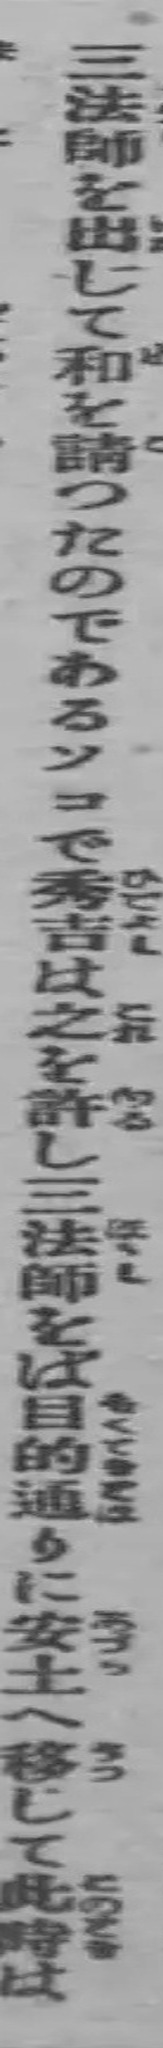三法師を出して和を請つたのであるソコで秀吉は之を許し三法師をば目的通りに安土へ移して此時は
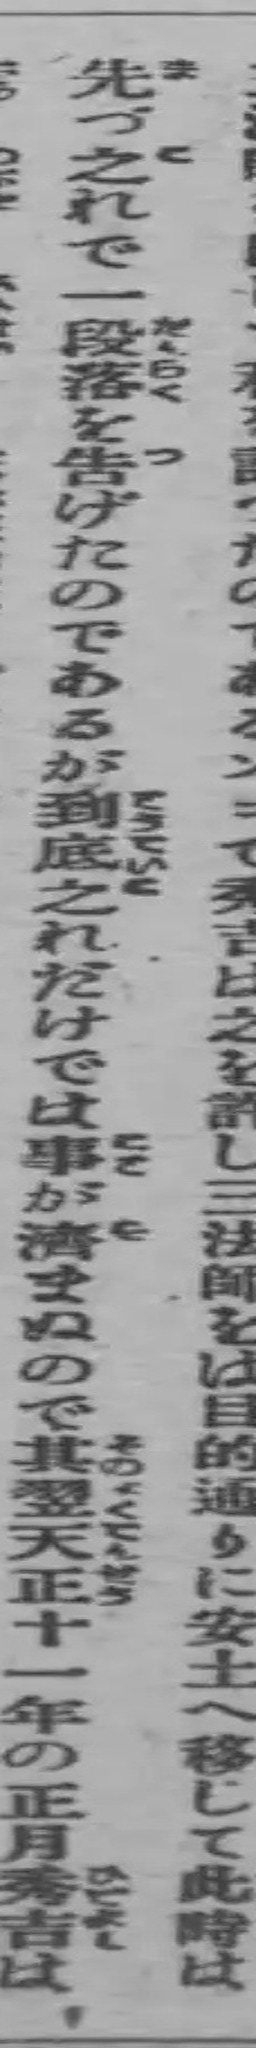先づ之れで一段落を告げたのであるが到底之れだけでは事が済まぬので其翌天正十一年の正月秀吉は
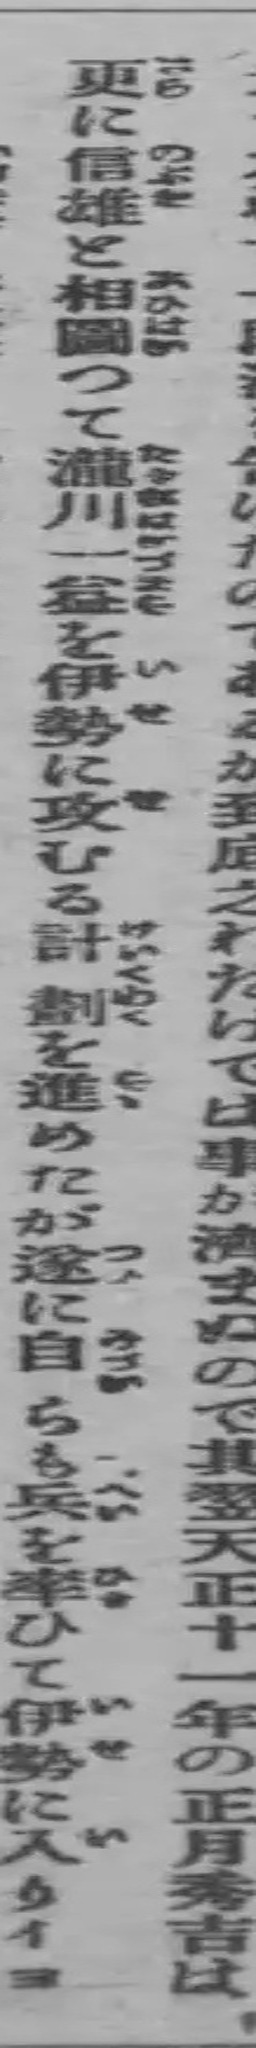伊勢征伐更に信雄と相図つて瀧川一益を伊勢に攻むる計割を進めたが遂に自らも兵を率ひて伊勢に入りイヨ
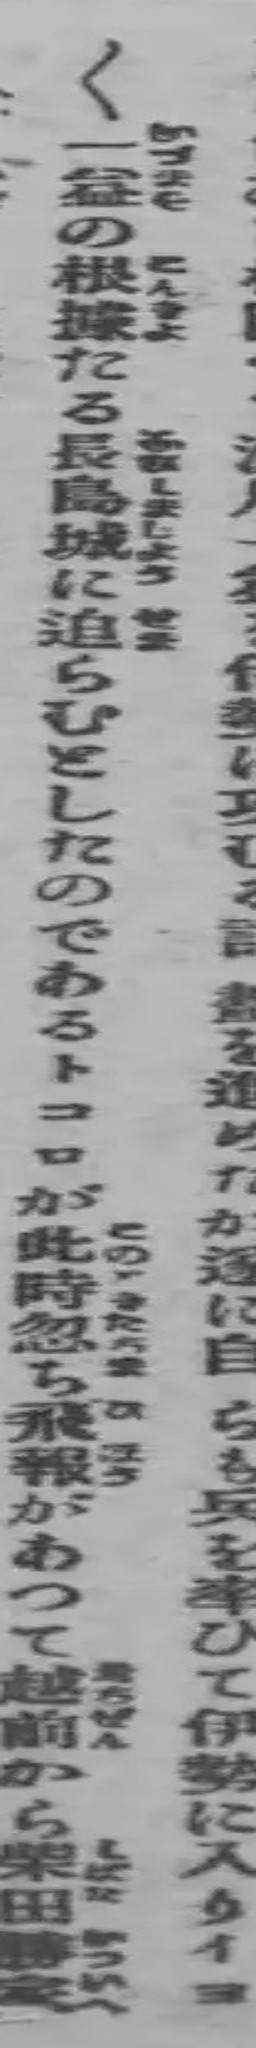〳〵一益の根拠たる長島城に迫らむとしたのであるトコロが此時忽ち飛報があつて越前から柴田勝家
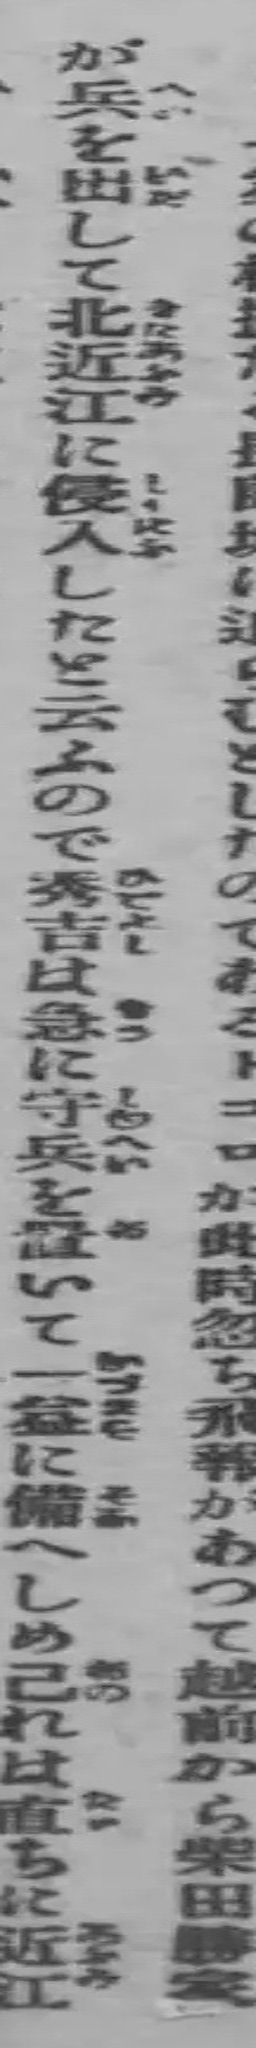が兵を出して北近江に侵入したと云ふので秀吉は急に守兵を置いて一益に備へしめ己れは直ちに近江
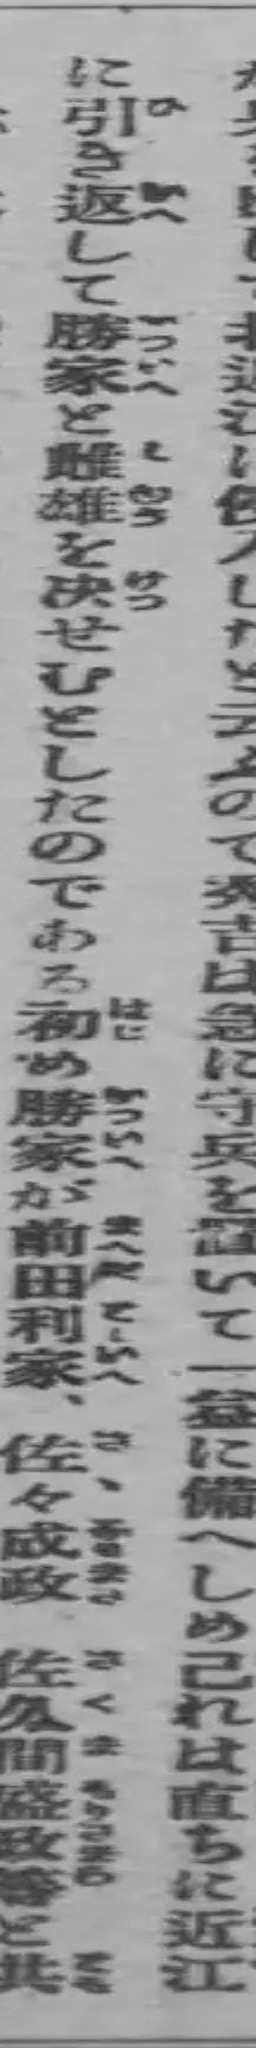に引き返して勝家と雌雄を決せむとしたのである初め勝家が前田利家、佐々成政、佐久間盛政等と共
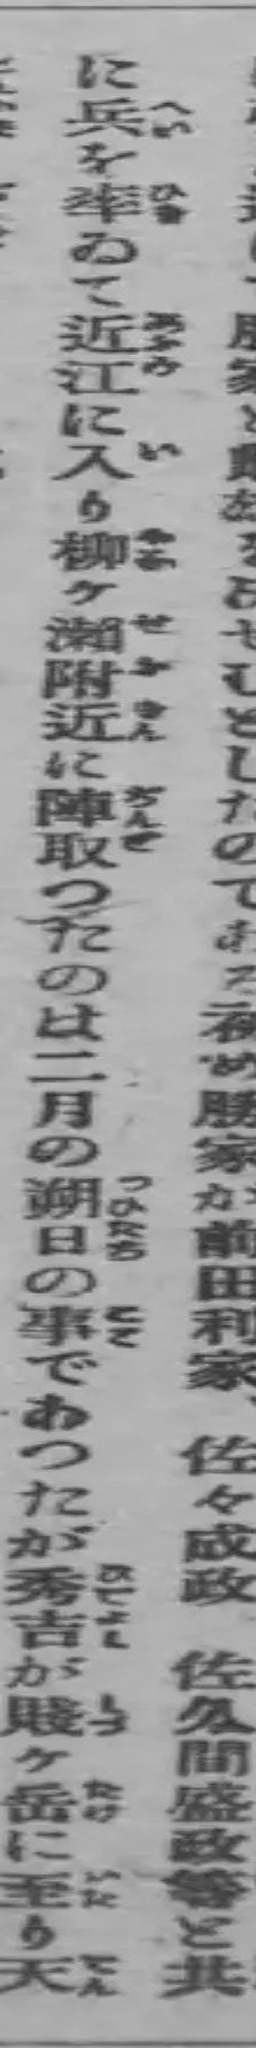柳ケ瀬役に兵を率ゐて近江に入り柳ケ瀬附近に陣取つたのは二月の朔日の事であつたが秀吉が賤ケ岳に至り天
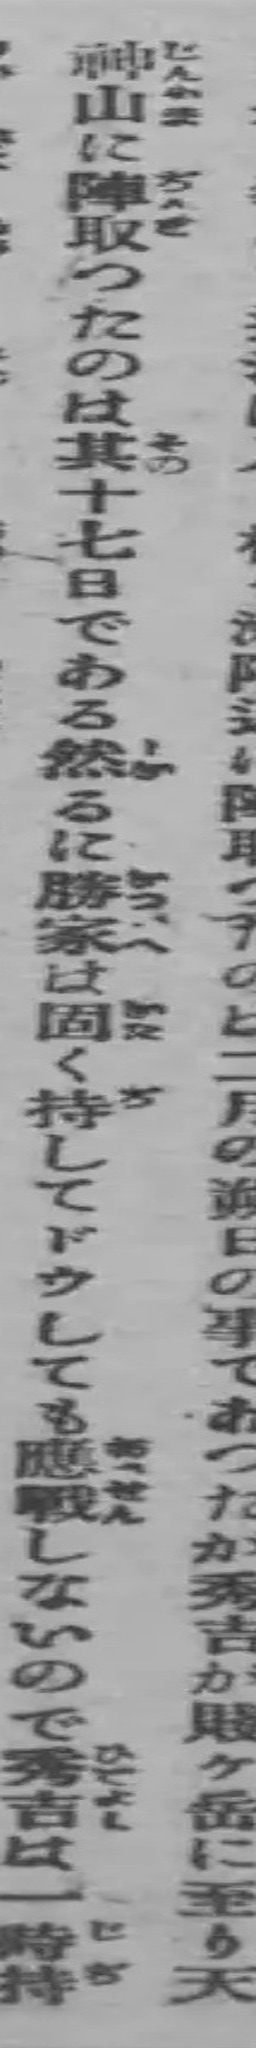神山に陣取つたのは其十七日である然るに勝家は固く持してドウしても応戦しないので秀吉は一時持
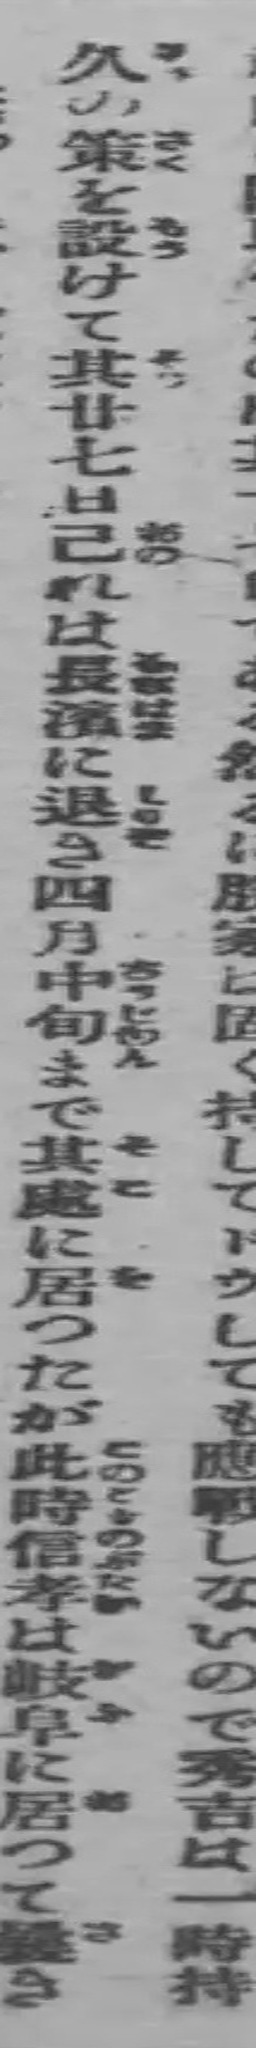久の策を設けて其廿七日己れは長浜に退き四月中旬まで其処に居つたが此時信孝は岐阜に居つて曩き
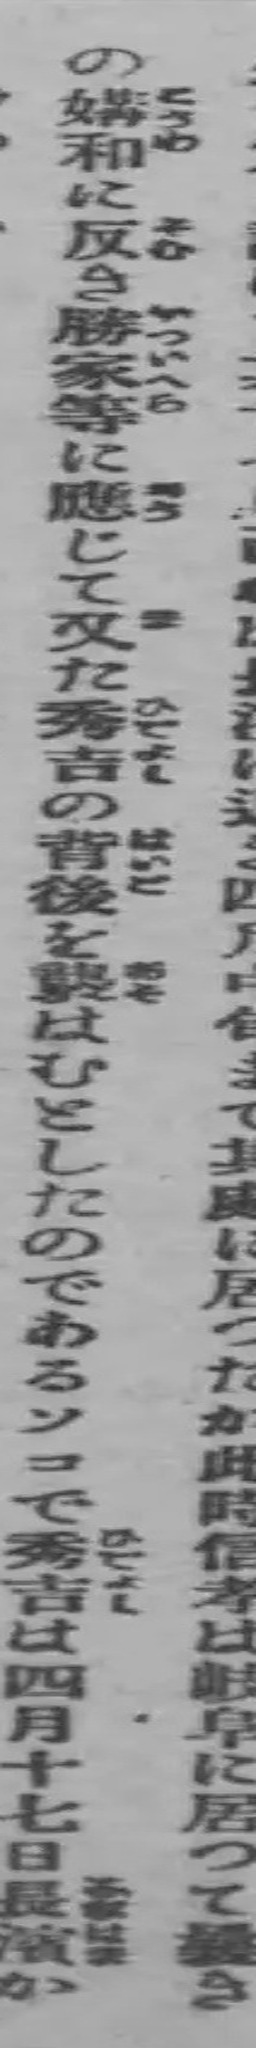の媾和に反き勝家等に応じて又た秀吉の背後を襲はむとしたのであるソコで秀吉は四月十七日長浜か
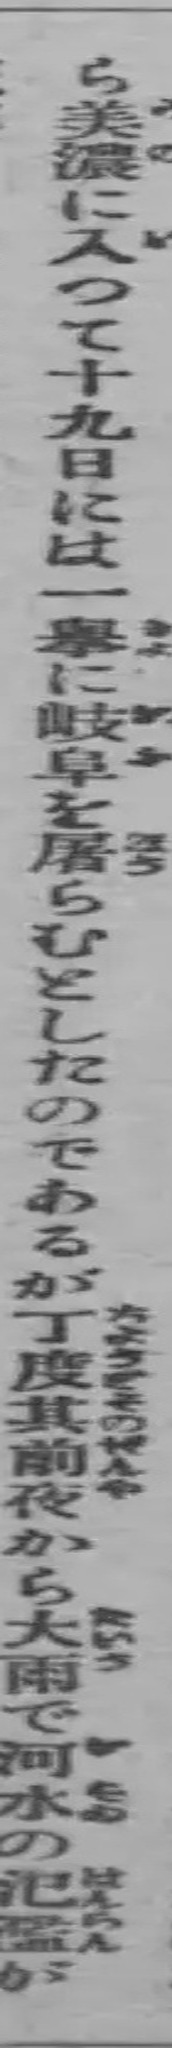ら美濃に入つて十九日には一挙に岐阜を屠らむとしたのであるが丁度其前夜から大雨で河水の氾濫が
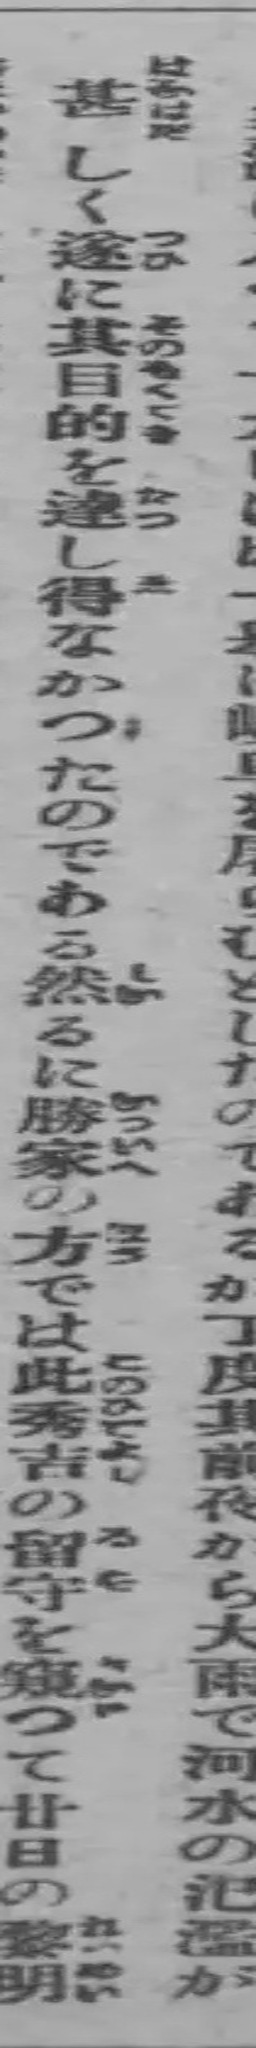甚しく遂に其目的を達し得なかつたのである然るに勝家の方では此秀吉の留守を窺つて廿日の黎明
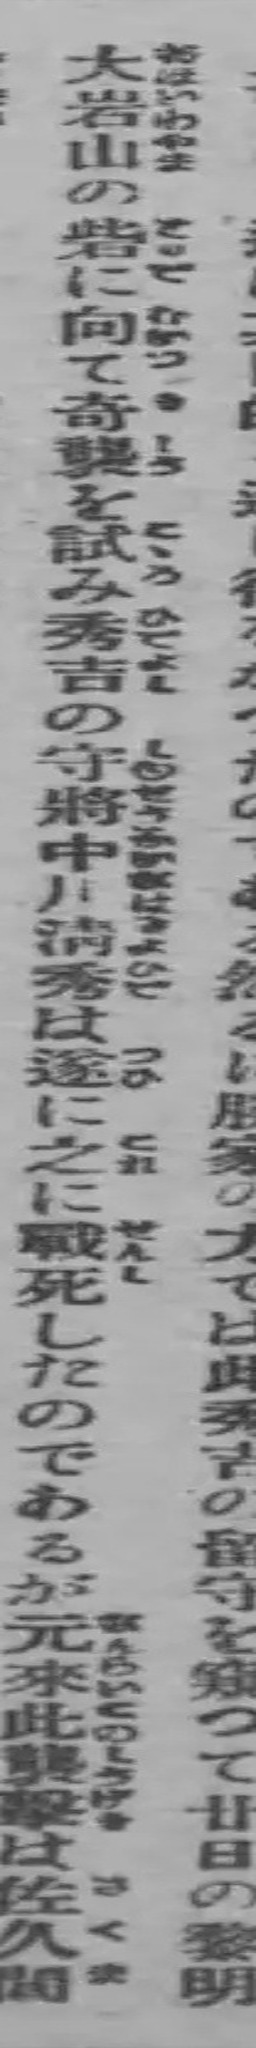大岩山の砦に向て奇襲を試み秀吉の守将中川清秀は遂に之に戦死したのであるが元来此襲撃は佐久間
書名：豊橋市史談
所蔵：国立国会図書館 National Diet Library, JAPAN
